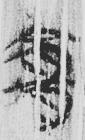宜
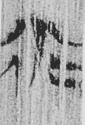小人
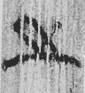之
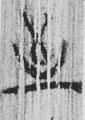至
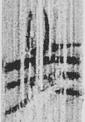者
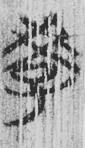○（教）
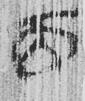而
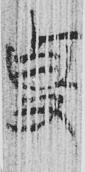○（使）
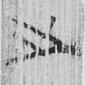之
